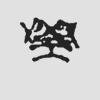閏
